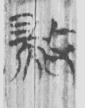{耑攴}
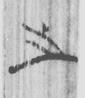之
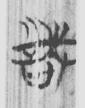{川言戈}
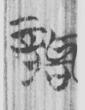詒
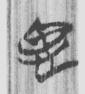思
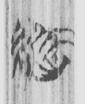{糸屈}
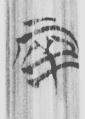兩
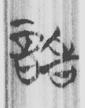誥
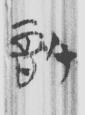信
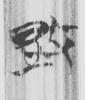{豆攴}
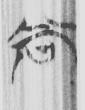尚
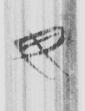母
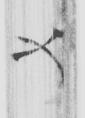又
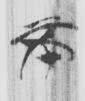不
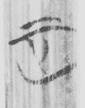正
